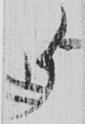此
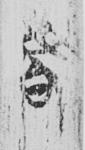○（乎）
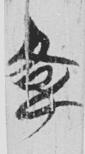韋（回）
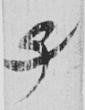子
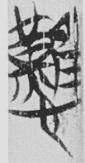戁（嘆）
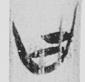曰
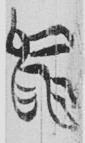烏
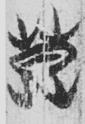莫
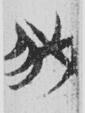我
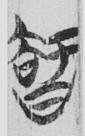智（知）
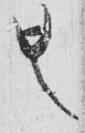也
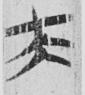夫
